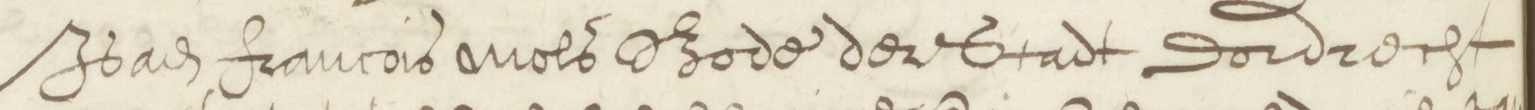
Is aen Francois Mols Bode der Stadt Dordrecht
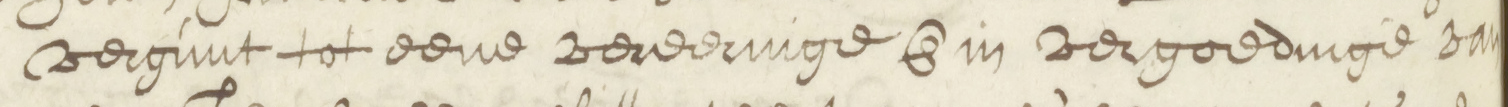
vergunt tot eene vereeringe & in vergoedinge van
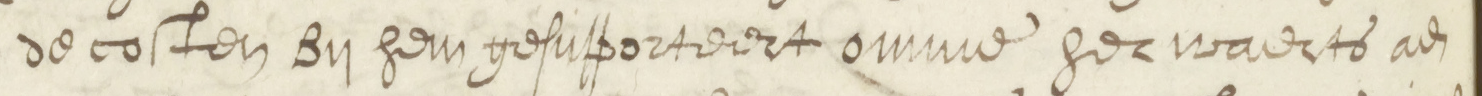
de costen by hem gesupporteert omme herwaerts aen
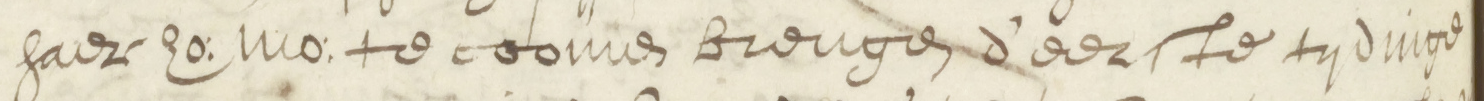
haer ho:mo: te coomen brengen d'eerste tydinge
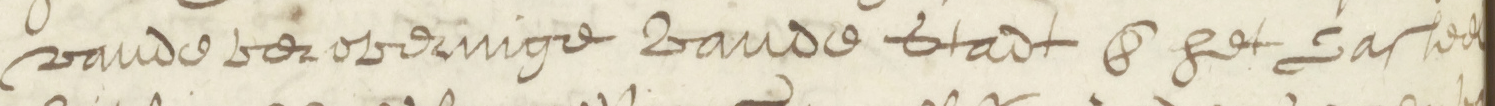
vande veroveringe vande stadt & het casteel
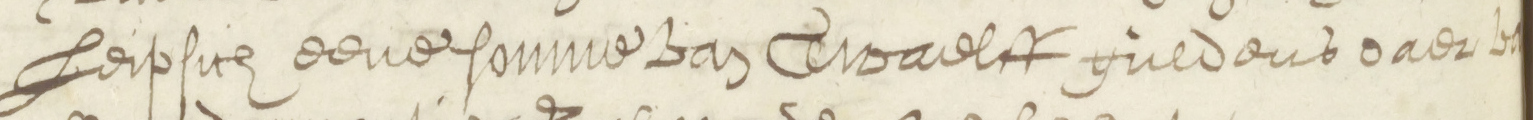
Leipsich eene somme van Twaelff guldens daer van
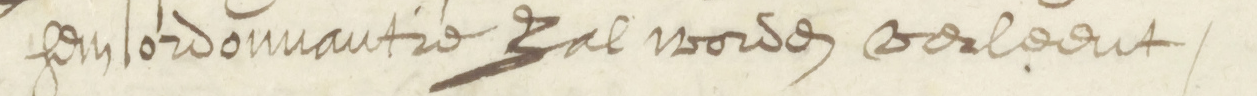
hem ordonnantie zal worden verleent.
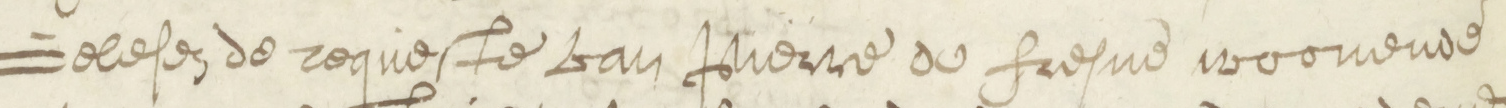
Gelesen de requeste van Pierre de Fresne woonende
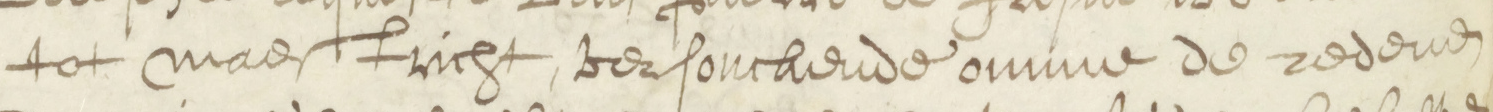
tot maestricht, versouckende omme de redenen
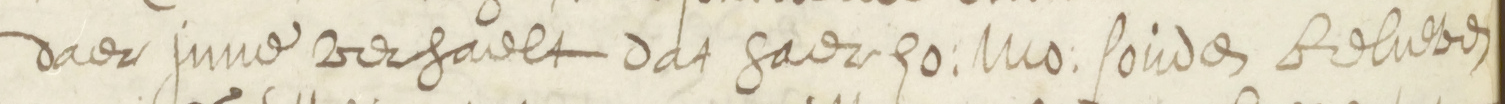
daer Inne verhaelt dat haer ho:mo: souden believen
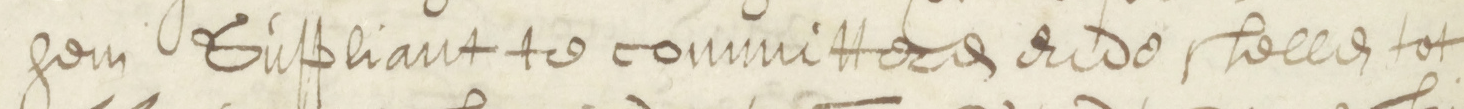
hem Suppliant te committeren ende stellen tot
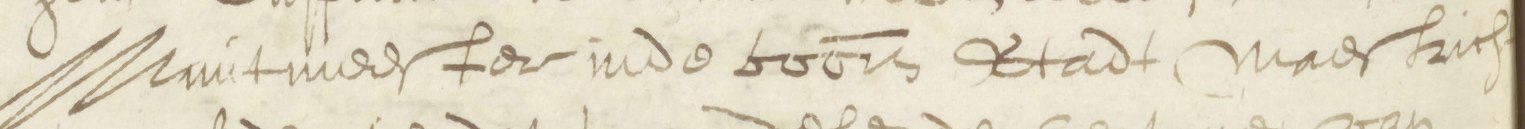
Muntmeester inde voorn Stadt Maestricht
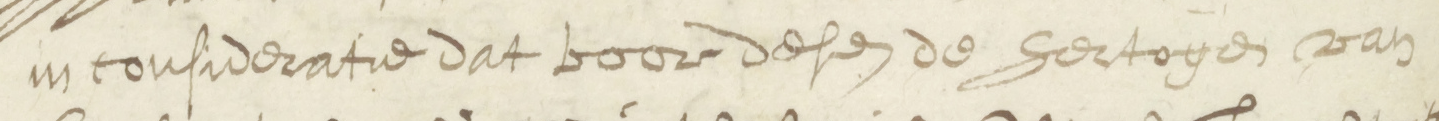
in consideratie dat voor desen de hertogen van
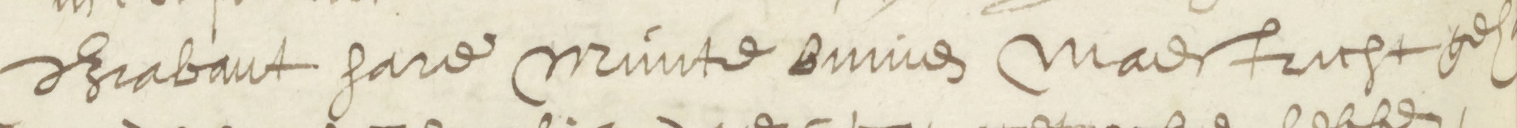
Brabant hare Munte binnen Maestricht geh
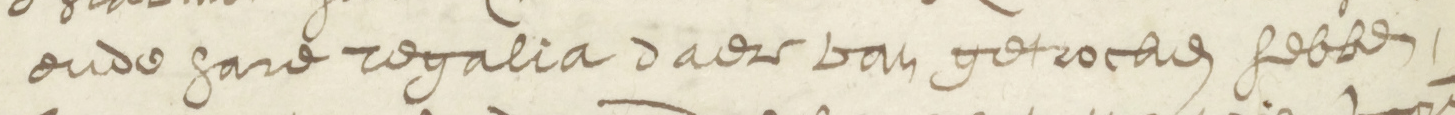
ende hare regalia daer van getrocken hebben.
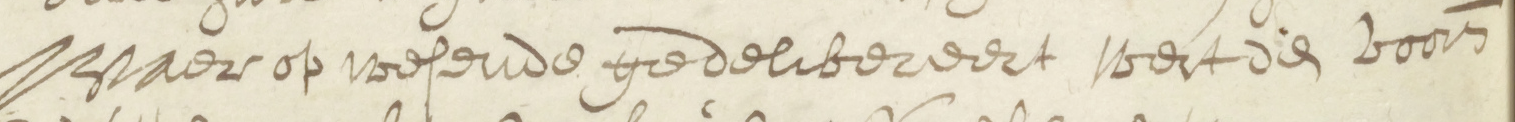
Waerop wesende gedelibereert wert den voorn
